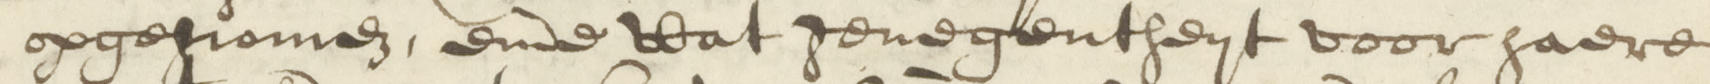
opgenomen, ende wat genegentheijt voor haere
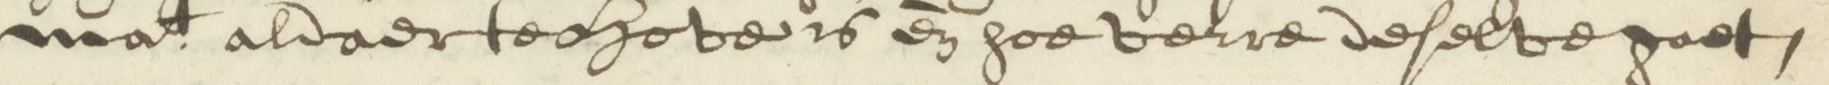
Mat. aldaer te Hove is en hoe verre deselve gaet.
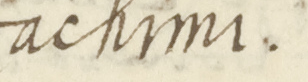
Joachimi.
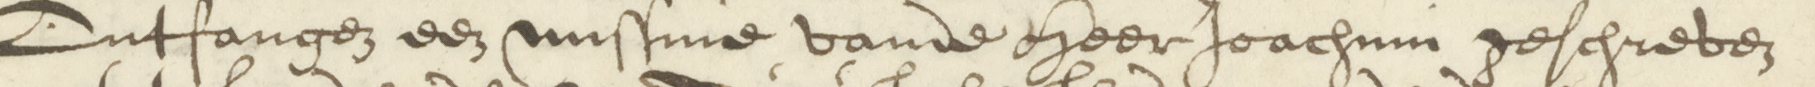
Ontfangen een missive vande Heer Joachimi geschreven
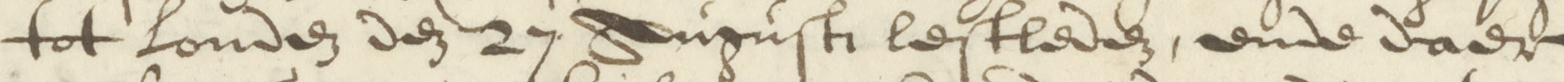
tot Londen den 27 Augusti lestleden, ende daer
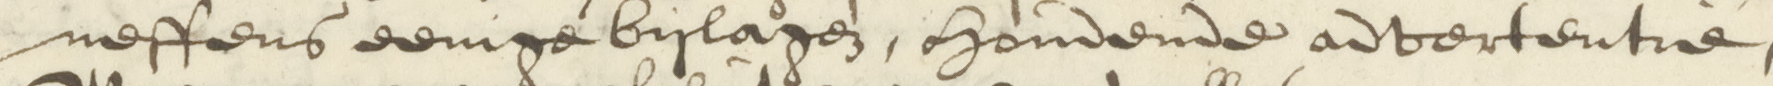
neffens eenige bijlagen, houdende advertentie,
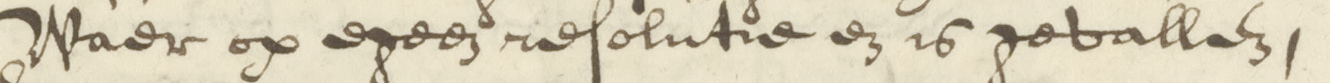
Waer op egeen resolutie en is gevallen.
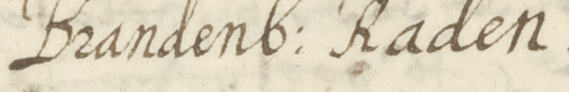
Brandenb: Raden
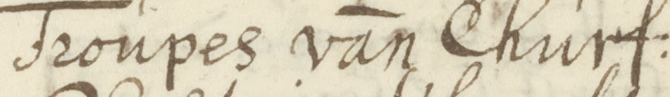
Troupes van Churf:
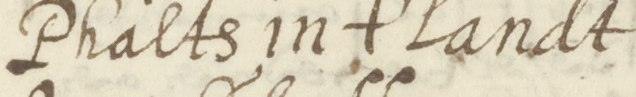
Phalts in t'Landt
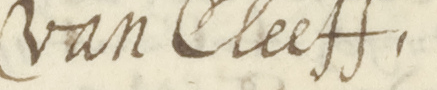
van Cleeff.
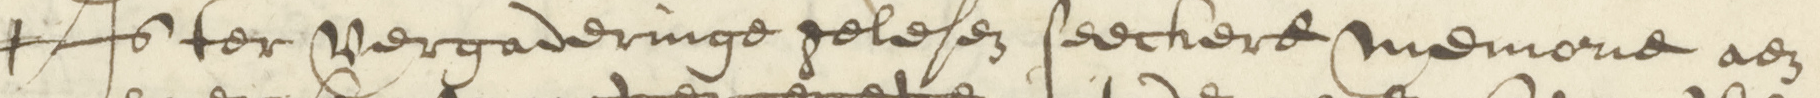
Is ter vergaderinge gelesen seeckere memorie aen
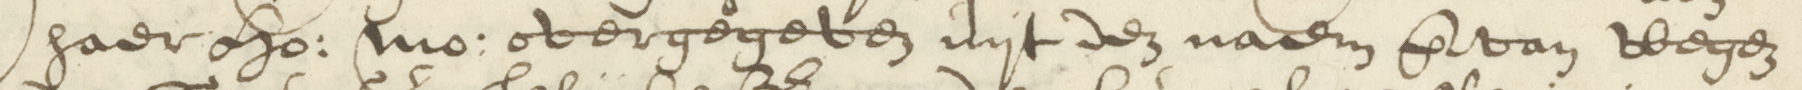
haer Ho:Mo: overgegeven uijt den naem & van wegen
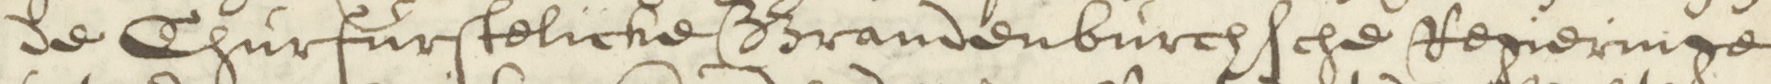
de Churfurstelicke Brandenburchsche Regieringe
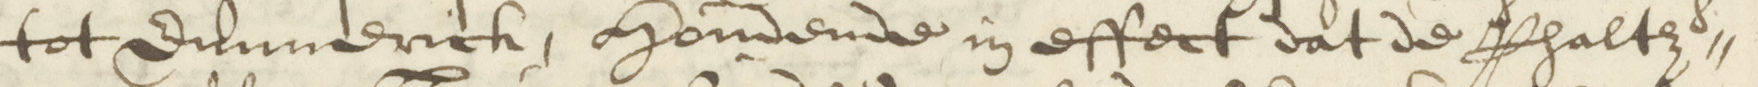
tot Emmerick, houdende in effect dat de Phaltz„
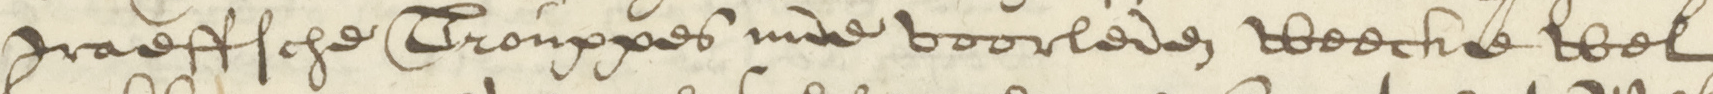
graeffsche Trouppes inde voorleden weecke wel
